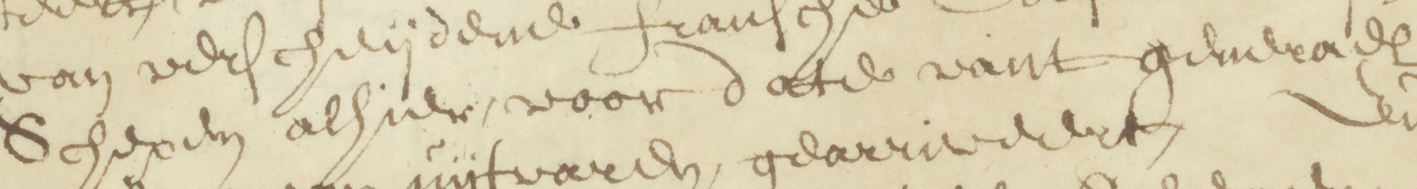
Schepen alhier, voor date vant generael
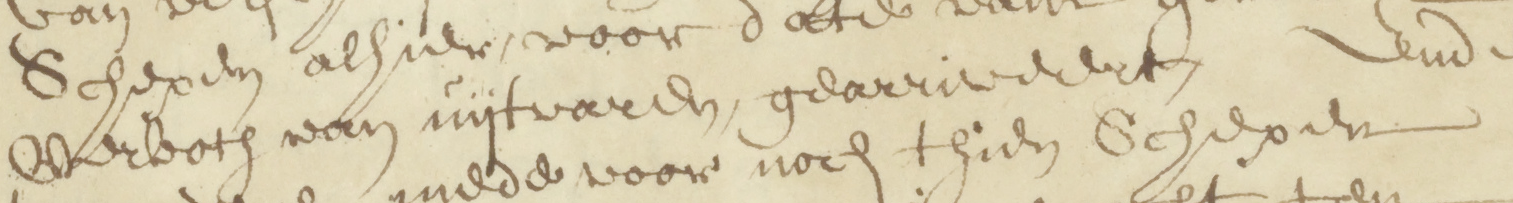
Verboth van uijtvaren, gearriveert. Ende
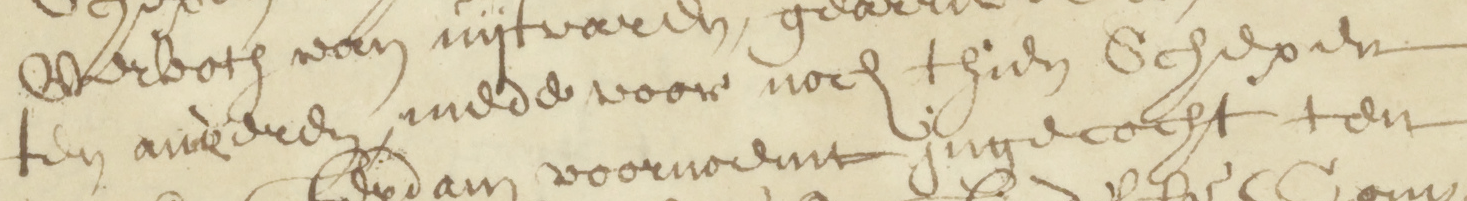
ten anderen mede voor noch thien Schepen
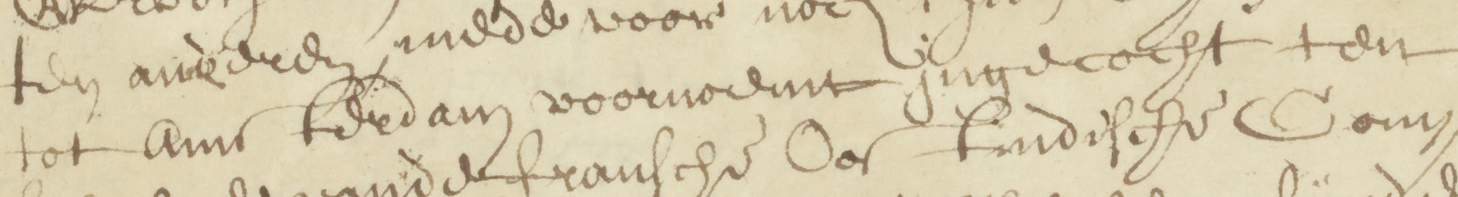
tot Amsterdam voornoemt ingecocht ten
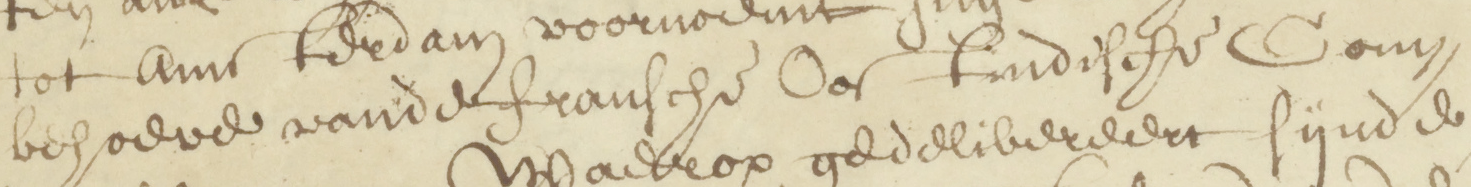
behoeve vande fransche Oostindische Com„
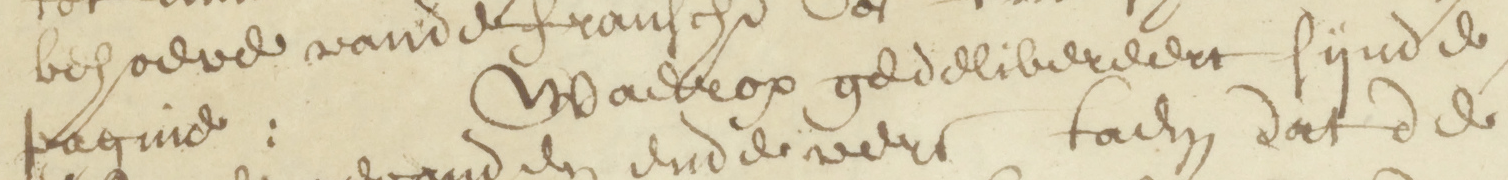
pagnie: Waerop gedelibereert sijnde,
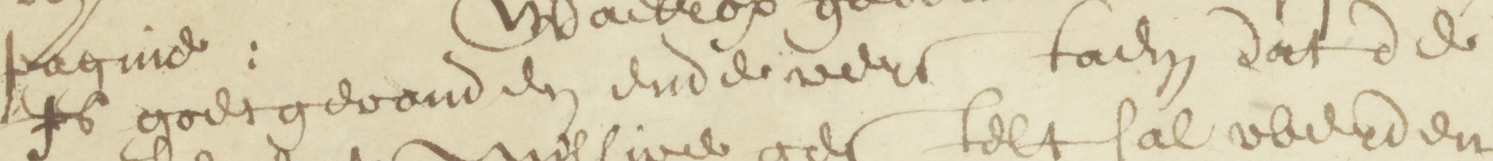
Is goetgevonden ende verstaen, dat de
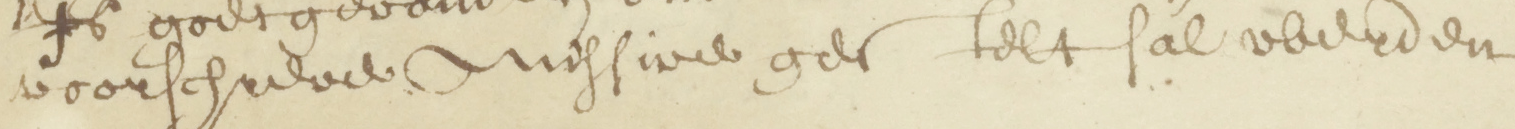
voorschreve Missive gestelt sal werden
